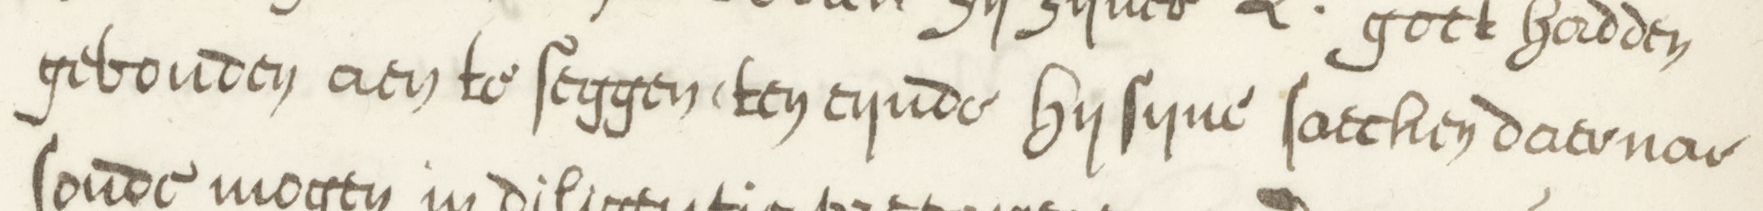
gevonden aen te seggen, ten eynde hy syne saecken daernae
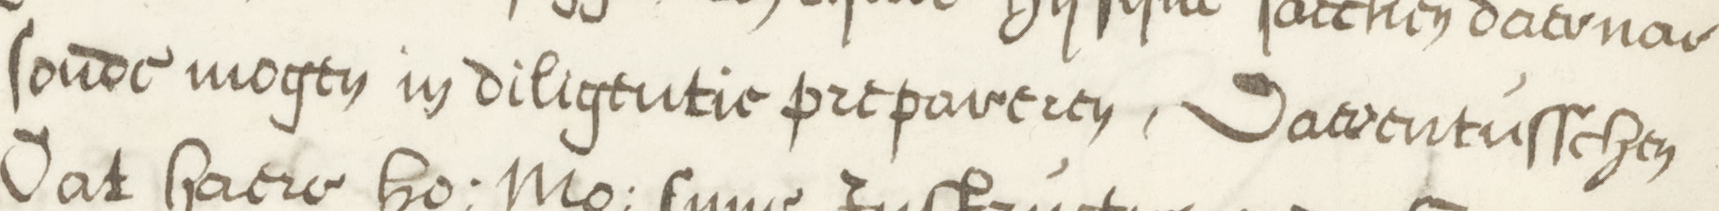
soude mogen in diligentie prepareren. Daerentusschen
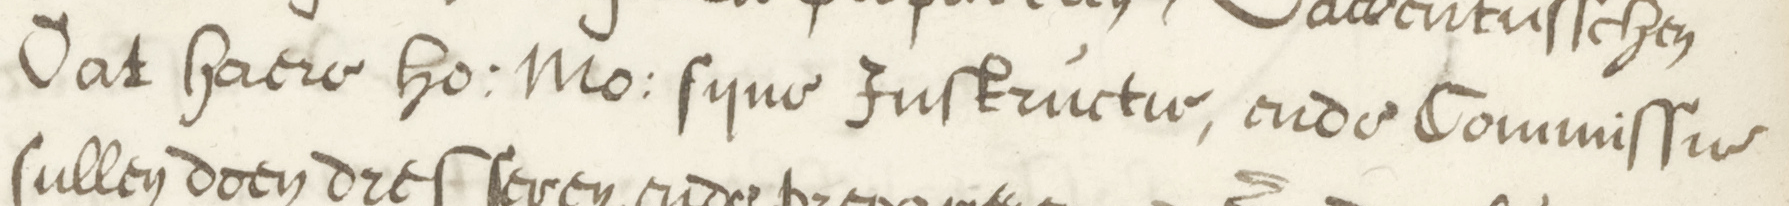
Dat haere Ho:Mo: syne Instructie, ende Commissie
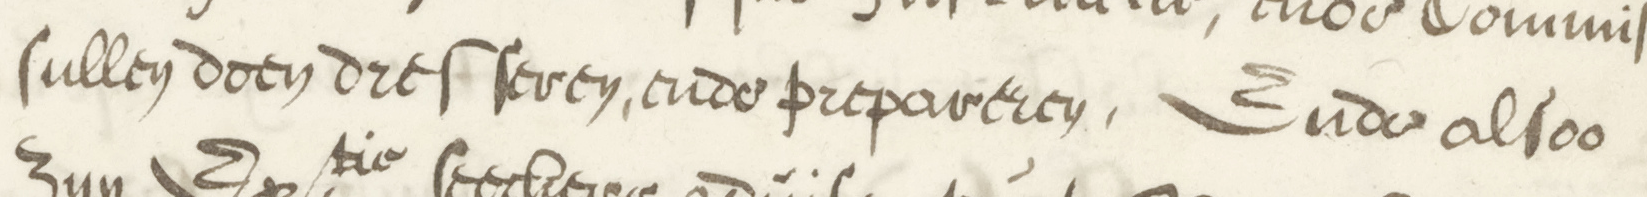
sullen doen dresseren, ende prepareren. Ende alsoo
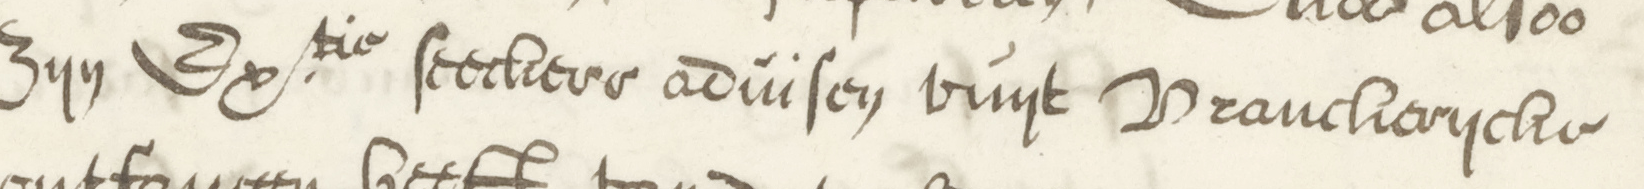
zyn Extie. seeckere aduisen vuyt Vranckerycke
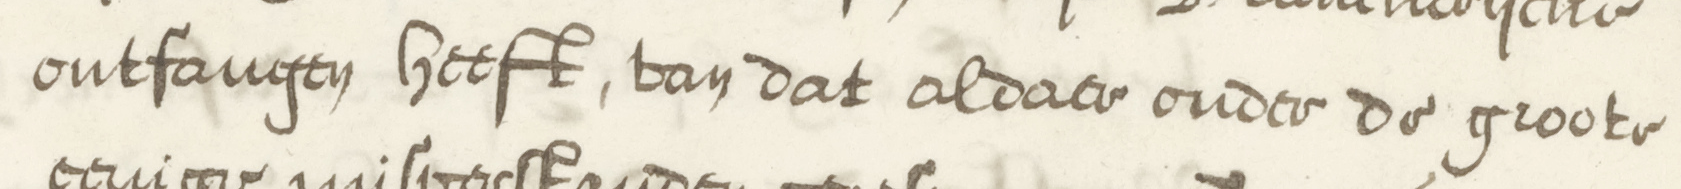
ontfangen heeft, van dat aldaer onder de groote
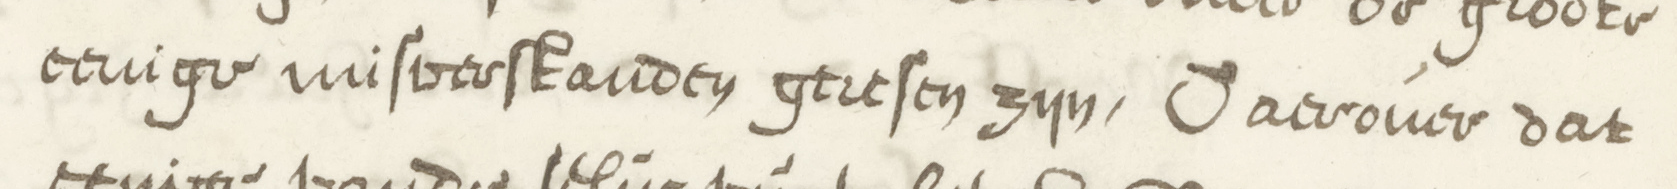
eenige misverstanden geresen zyn, Daerouer dat
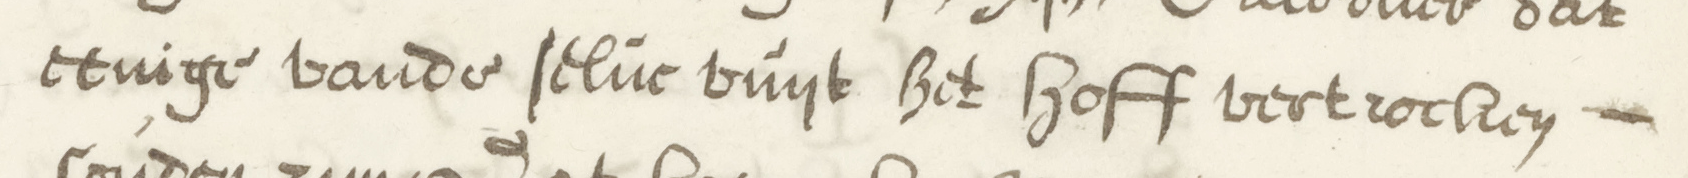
eenige vande selue vuyt het hoff vertrocken -
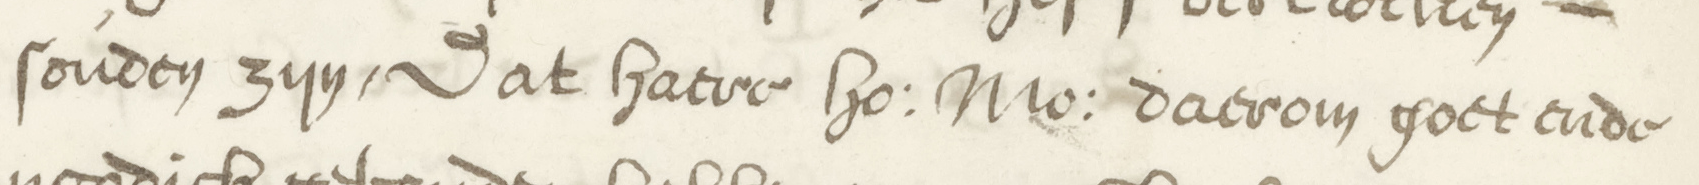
souden zyn, Dat haere Ho:Mo: daerom goet ende
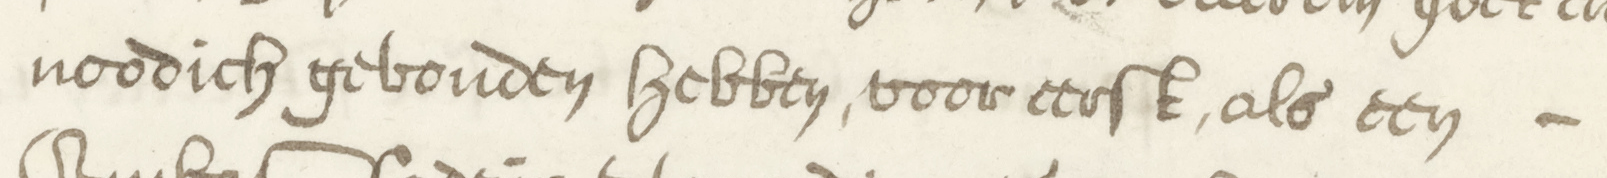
noodich gevonden hebben, voor eerst, als een
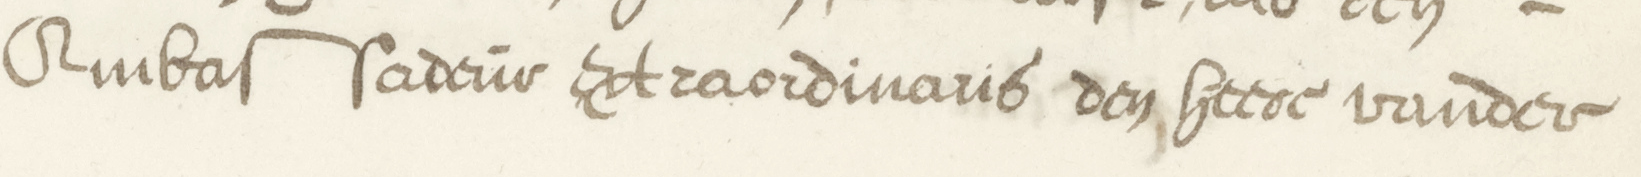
Ambassadeur ertraordinaris den heere vander
